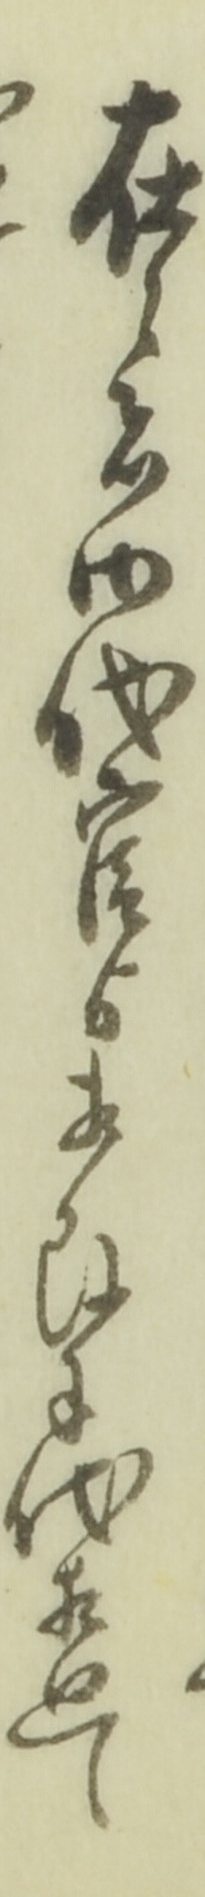在々者御代官ゟ相改手代相廻し
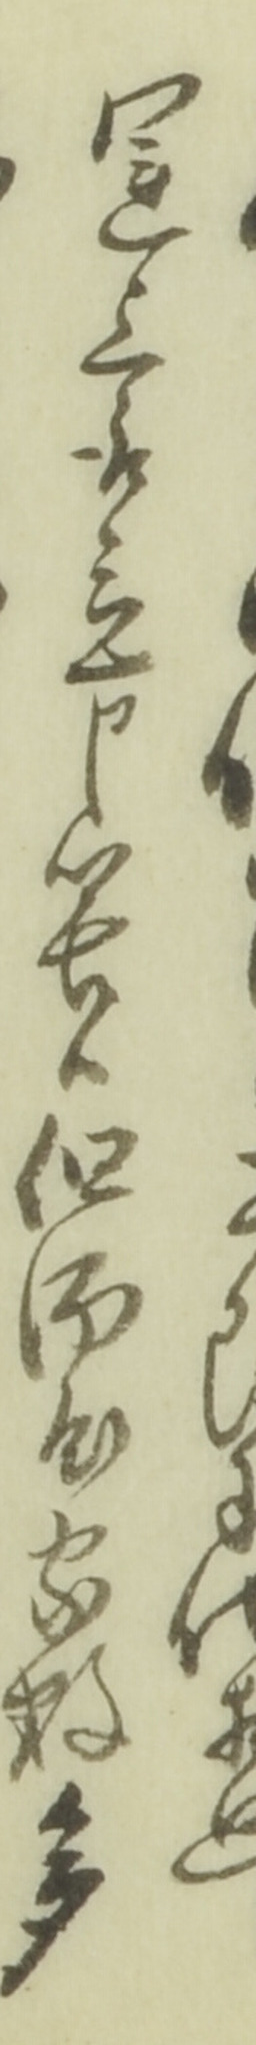運上取立申筈候但酒屋家数多
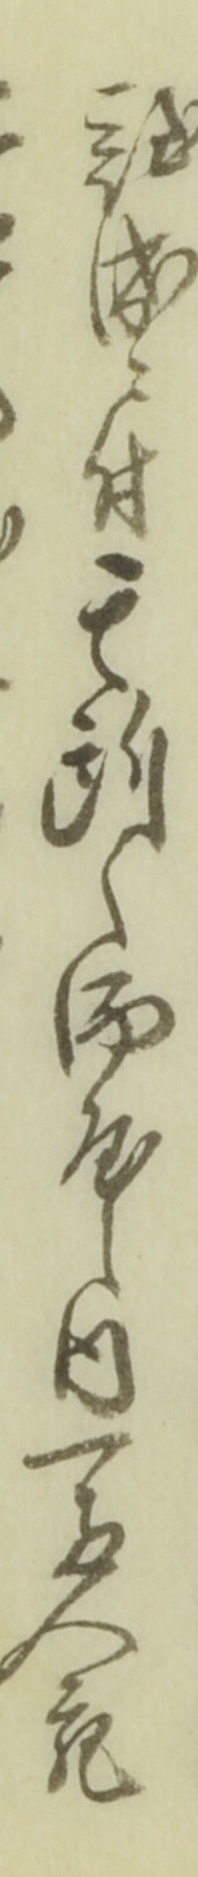難成ニ付其所之酒屋之内一両人歟
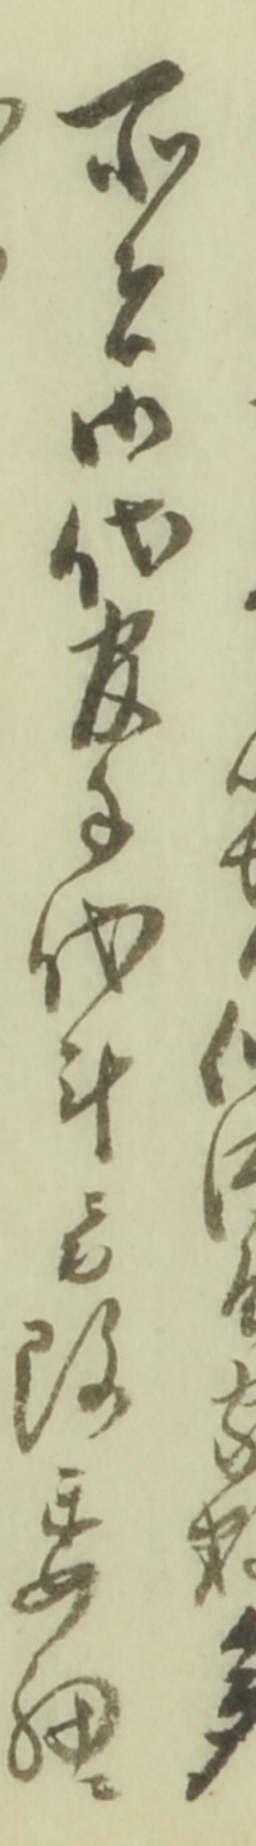所者御代官手代斗ニ而改委細ニ
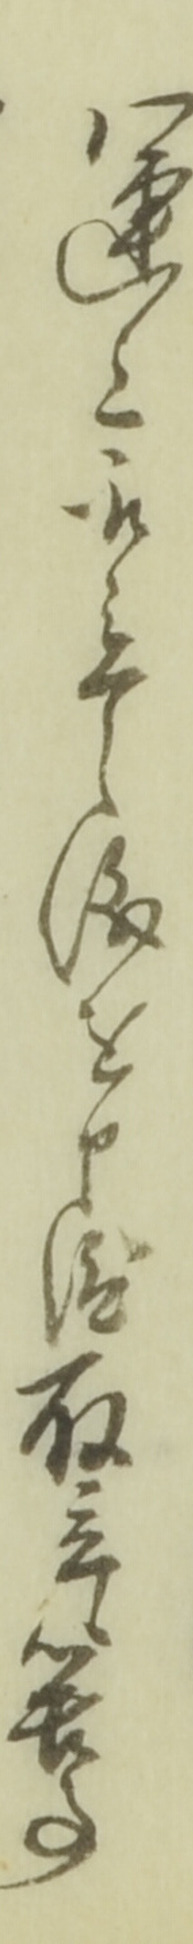運上取立之儀を申渡取立候筈事
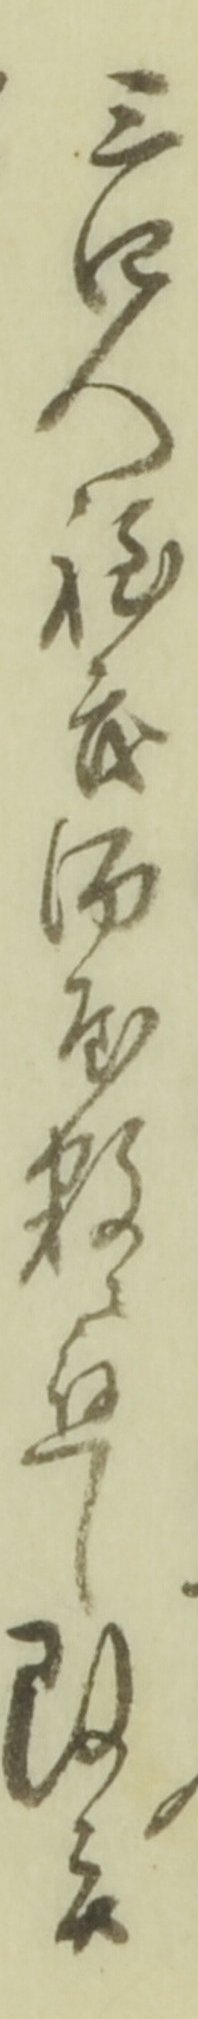三四人程茂酒屋数ニ応し改并
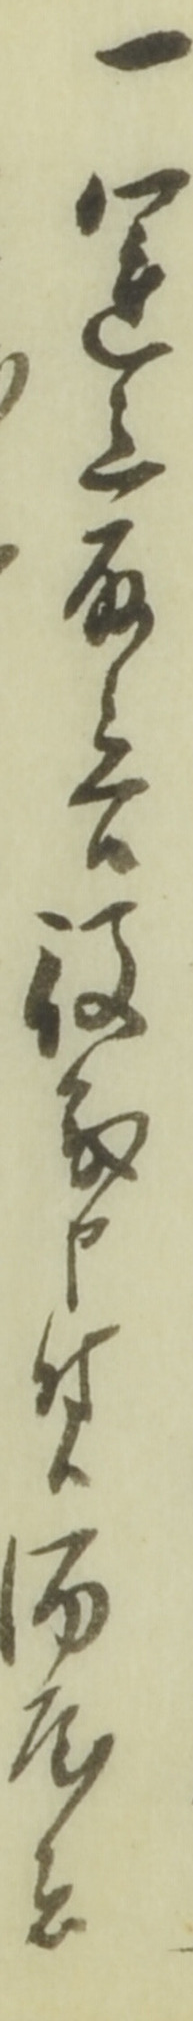一運上取立候役義申付候酒屋者
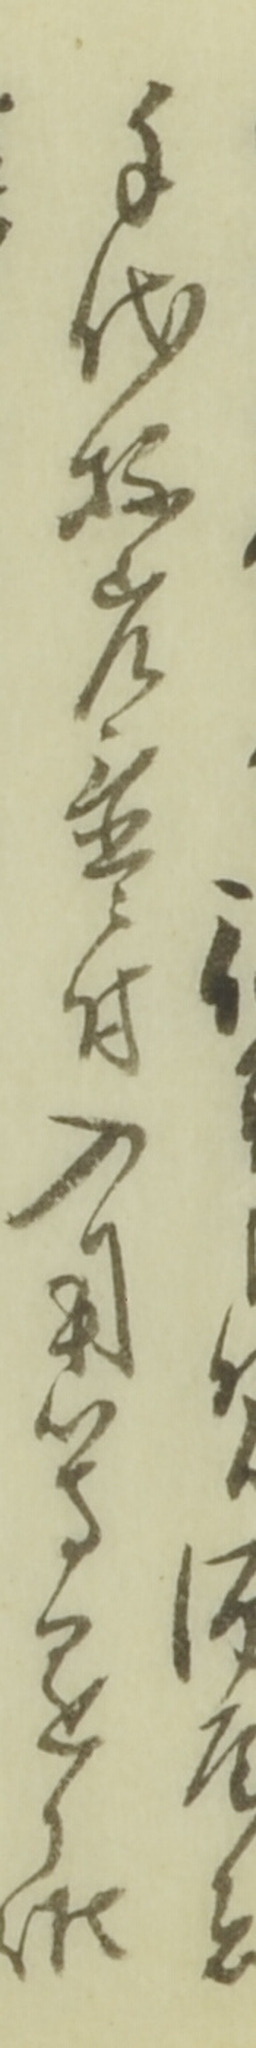手代抔差置ニ付入用等懸り候
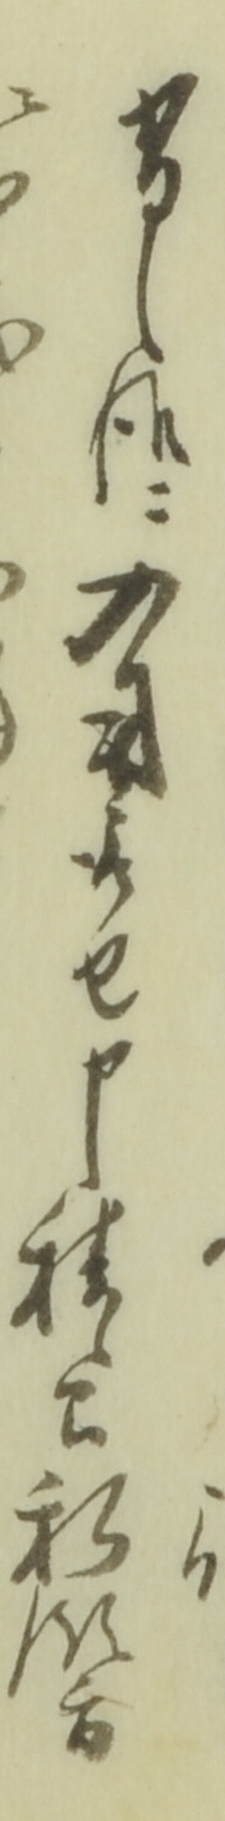有之様ニ入用取セ申積候間私領方
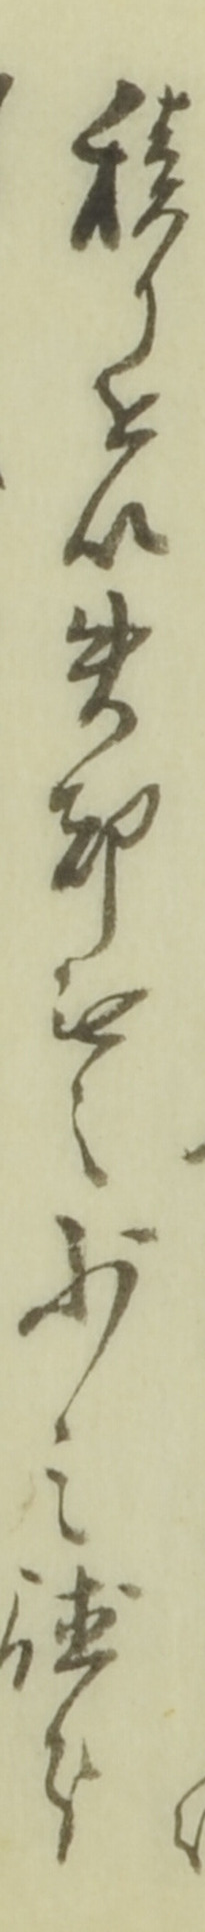積りを以失却無之少之徳分
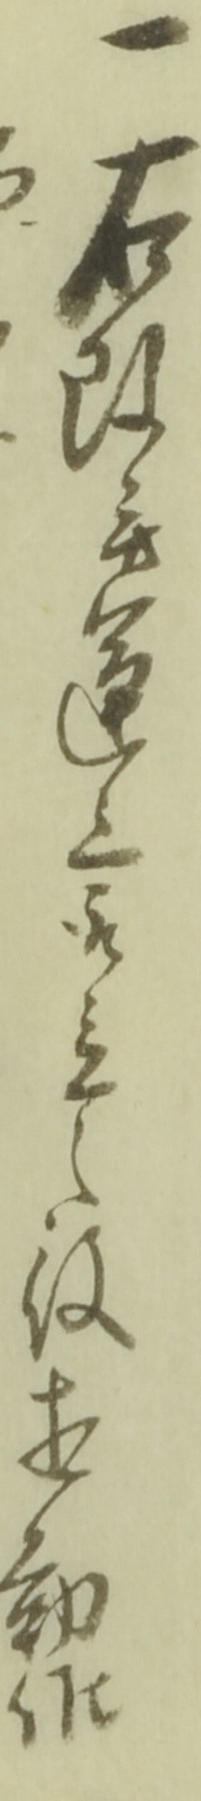一右改并運上取立之役相勤候
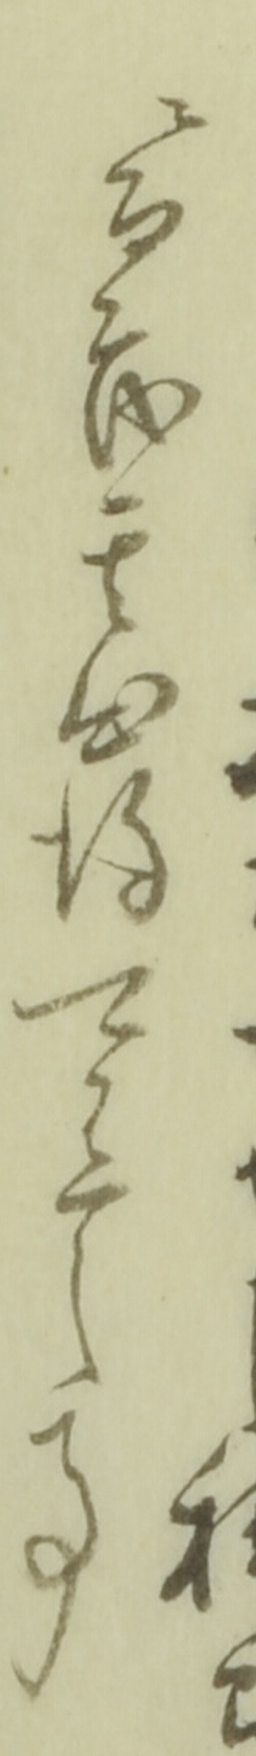ニ而茂其心得可有之事
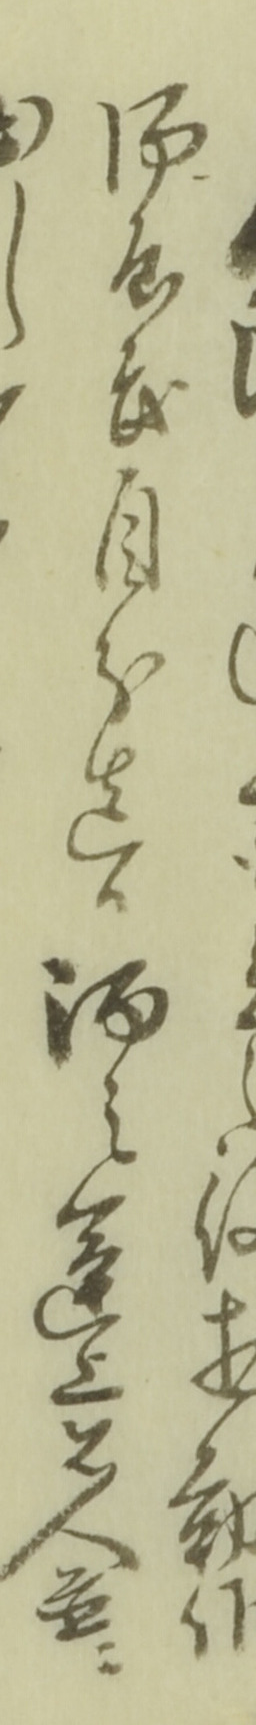酒屋茂自分造候酒之運上者人並ニ
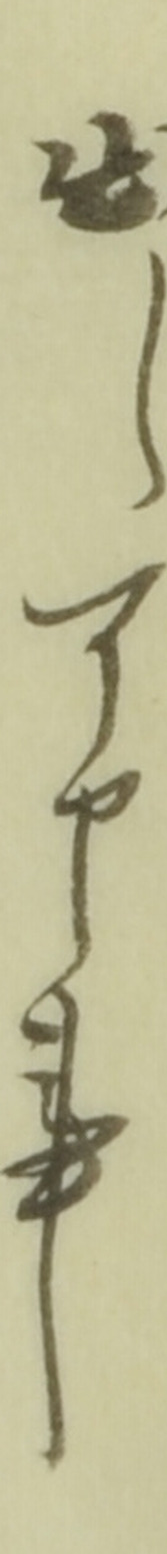出し可申事
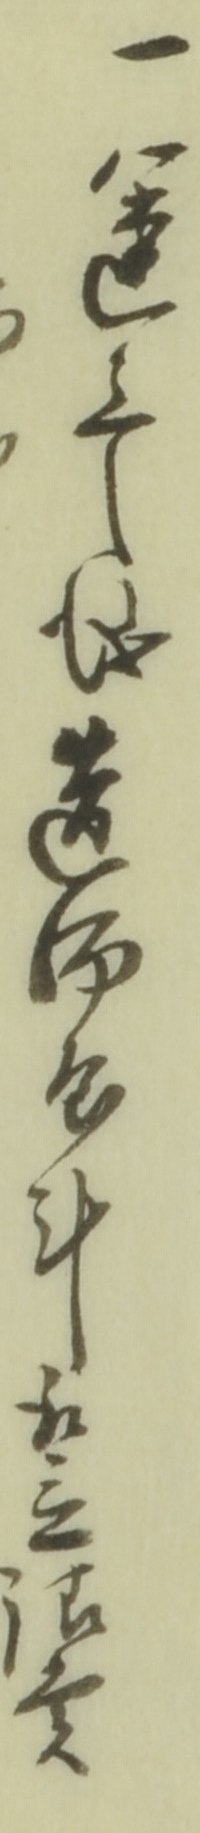一運上之儀造酒屋斗取立請売
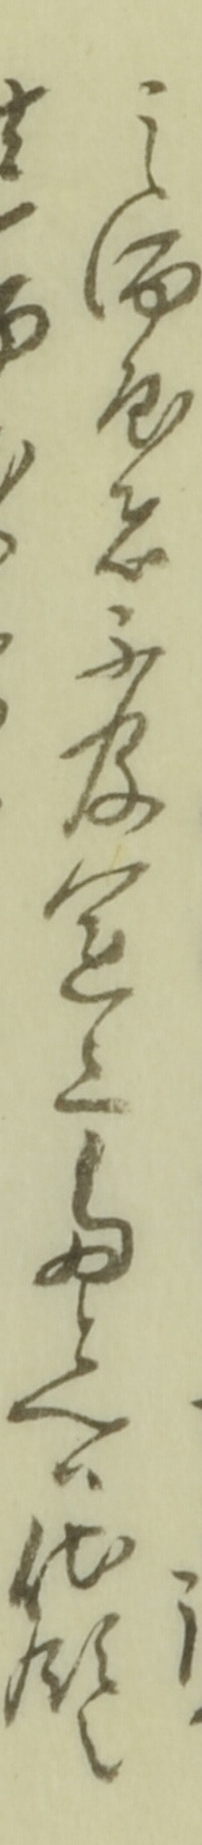之酒屋者不及運上たとへハ他領之
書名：御公儀様御領主様御触書控
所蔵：伊那市立高遠町図書館・合同会社AMANE
